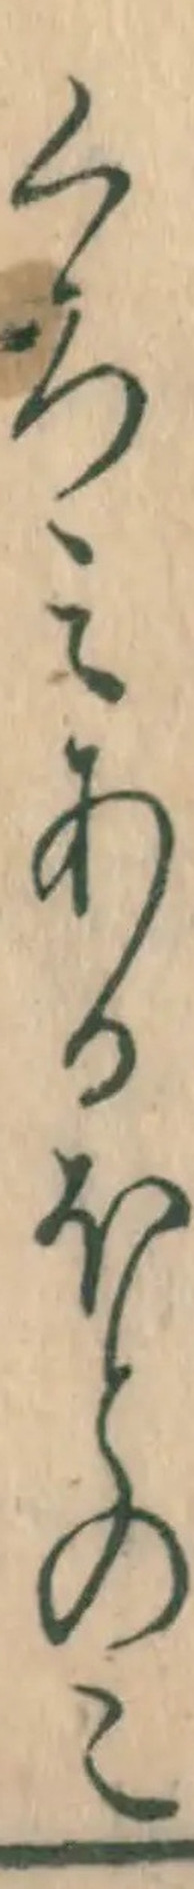くろみあるほとのこ
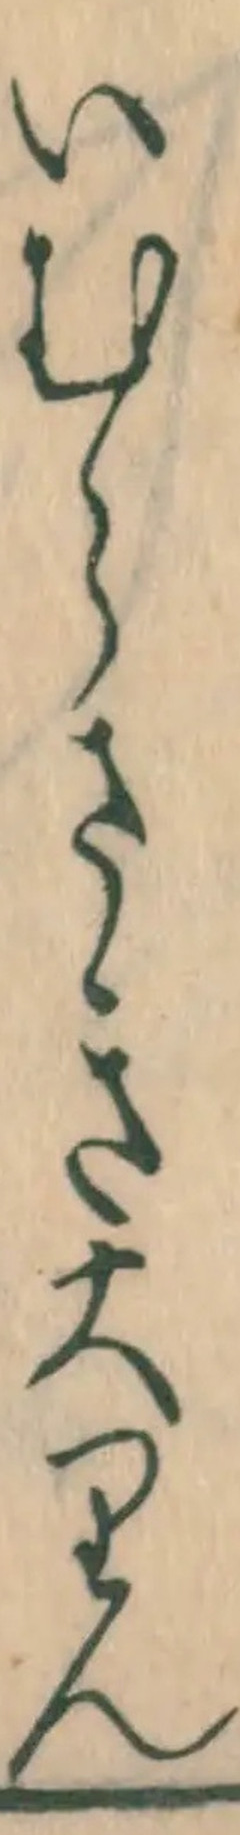いむらさき大りん
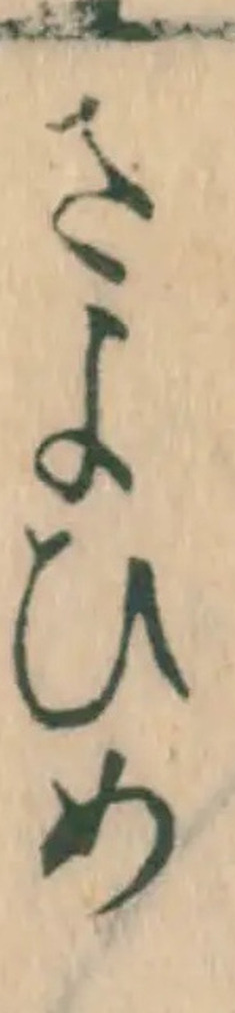さよひめ
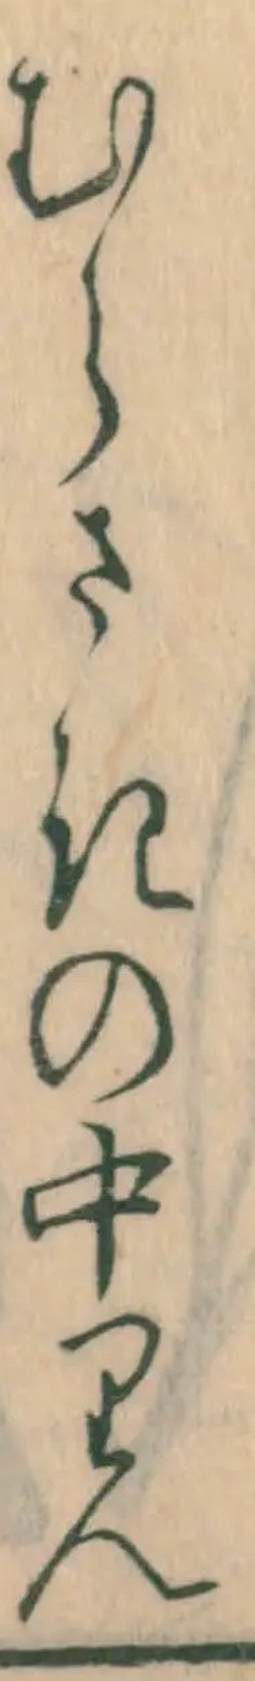むらさきの中りん
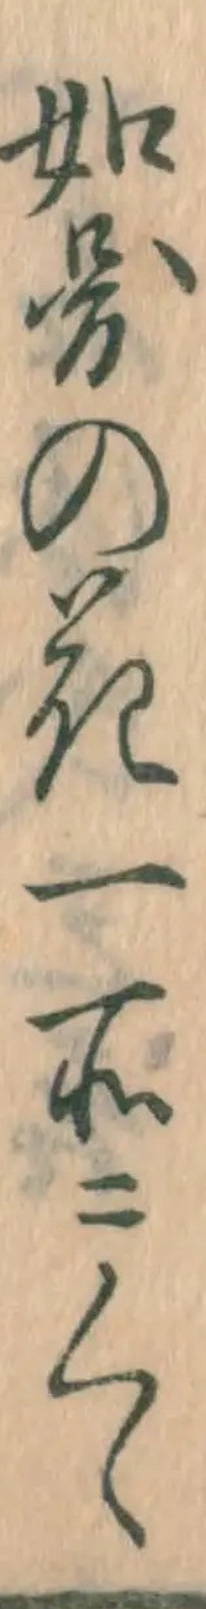如図の花一所にくゝ
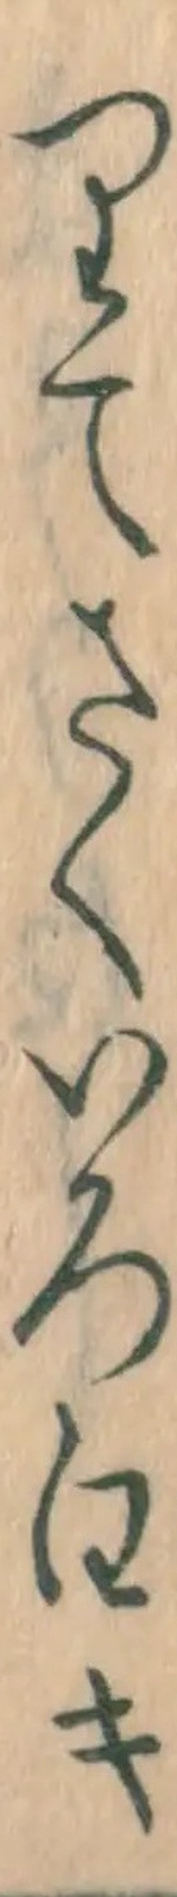りてさくいろ白き
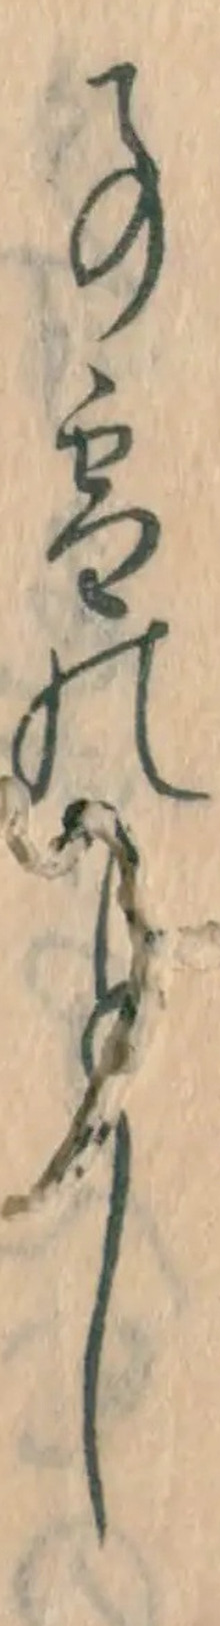事雪のことし
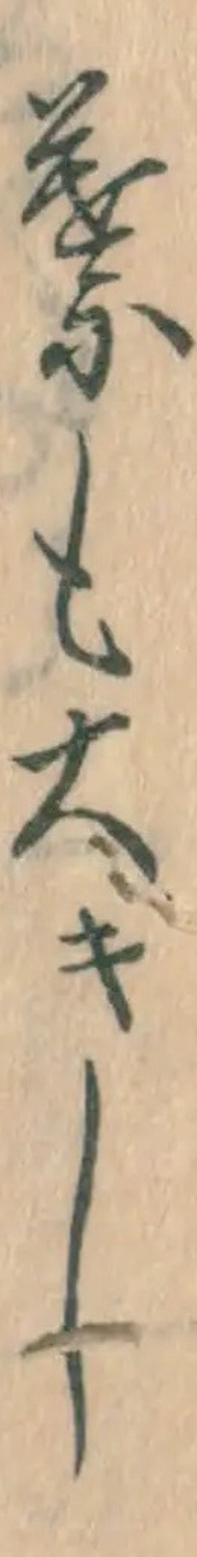葉も大きし

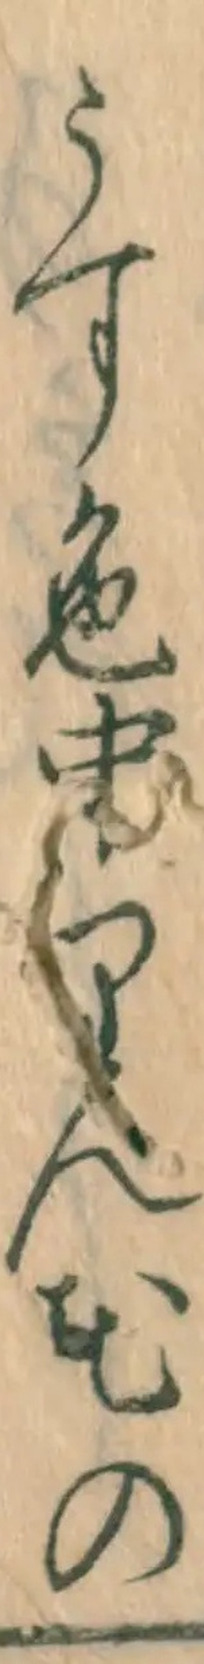うす色中りん花の
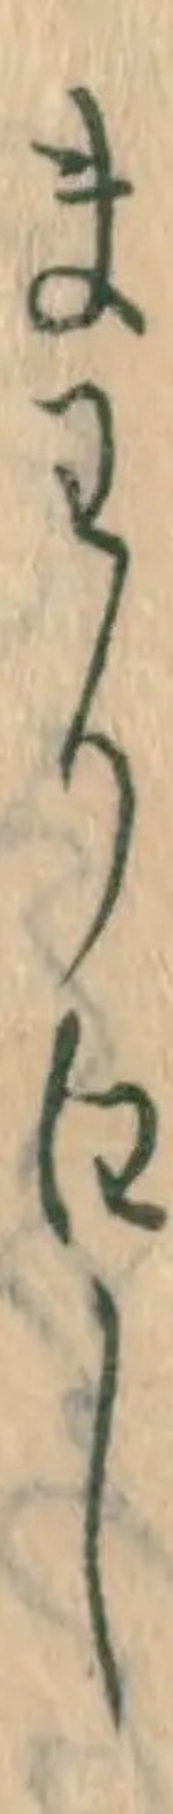まわり白し
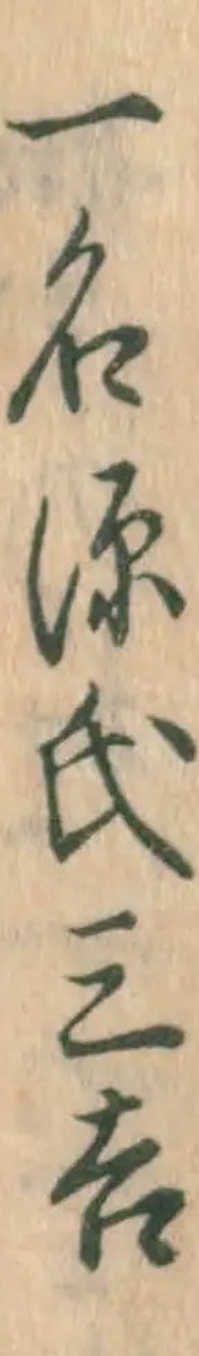一名源氏三吉
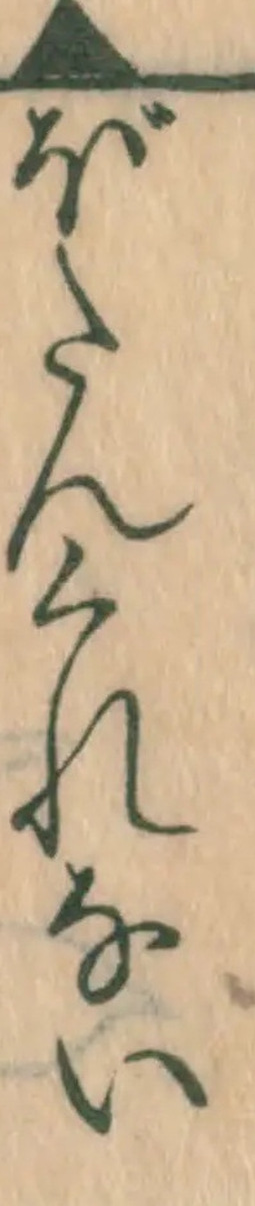▲ぼたんくれない
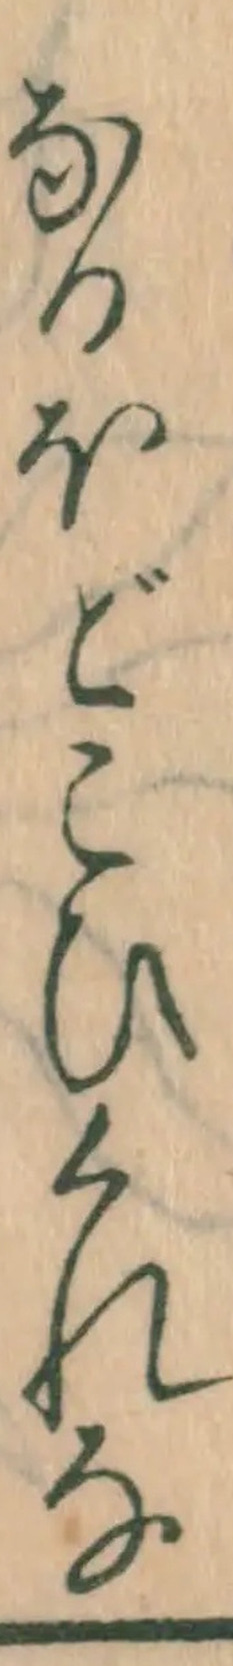なるほどこひくれな
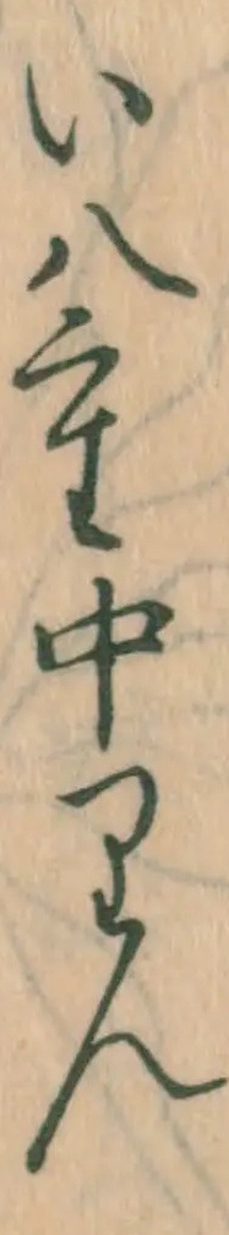い八重中りん
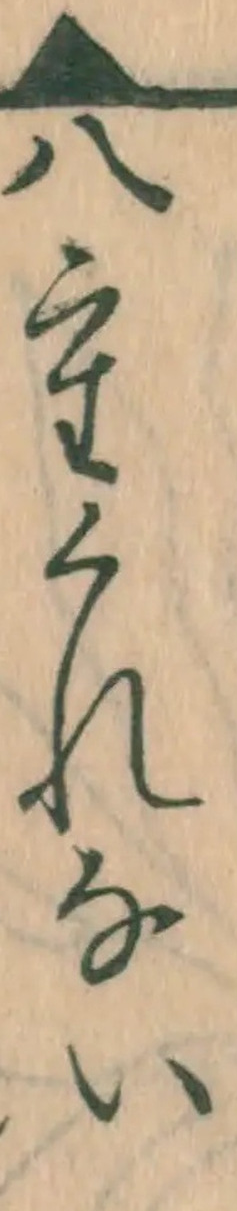▲八重くれない
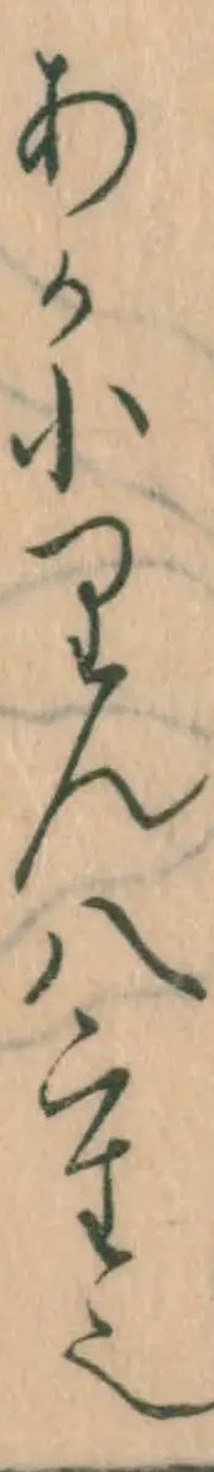あか小りん八重也
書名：錦繍枕 5巻. [3]
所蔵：国立国会図書館 National Diet Library, JAPAN
